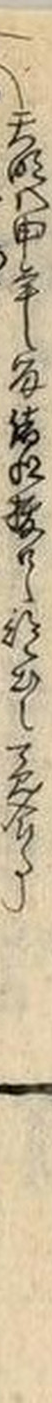天明八申年之留諸組援口之部へ出し可見合事
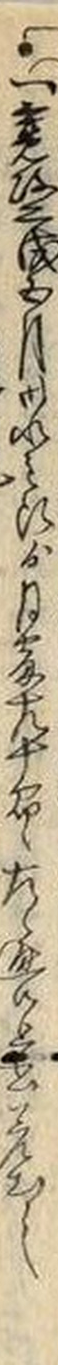一寛政二戌五月御水主頭ゟ月番左十郎へ左之通口上書差出候
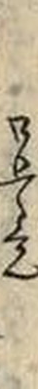口上之覚
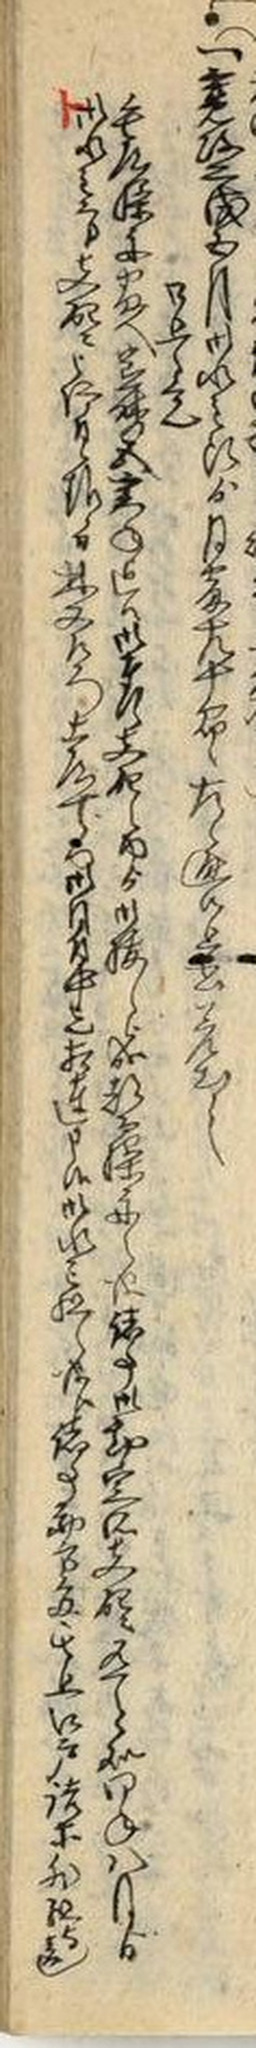毛屋繰舟番人宝暦五亥年迄は御奉行支配之内ゟ御援し被成都て繰舟之儀諸事御勘定所支配に有之候処同年八月ゟ
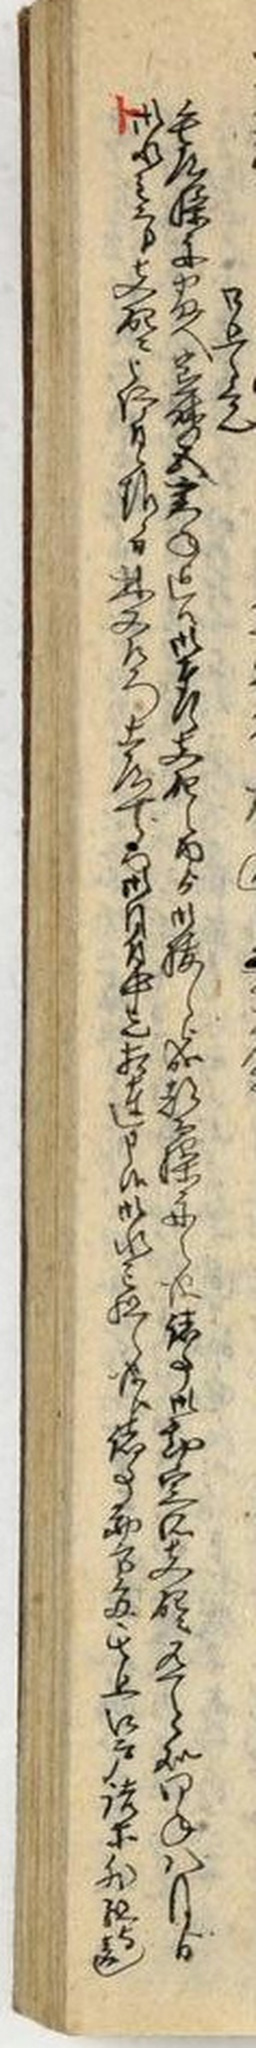御水主方支配に被仰付候趣に付林又左衛門土屋十郎右衛門御目付中迄相達申候御水主組之儀は諸事勤方多其上江戸詰等外組と違

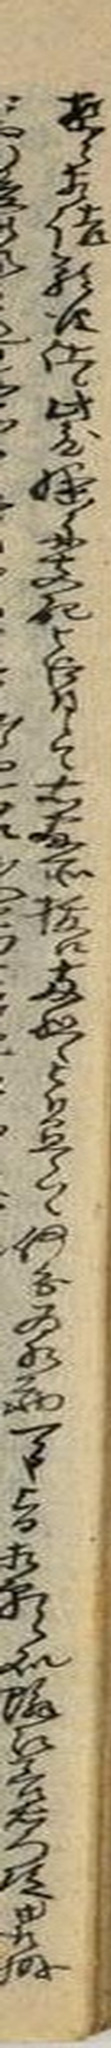夜に相詰難儀仕候此度繰舟支配被仰付候はゝ右番所援候両組へ被下置候はゝ何分為相勤可申旨相願候処蟹江善右衛門殿御取扱
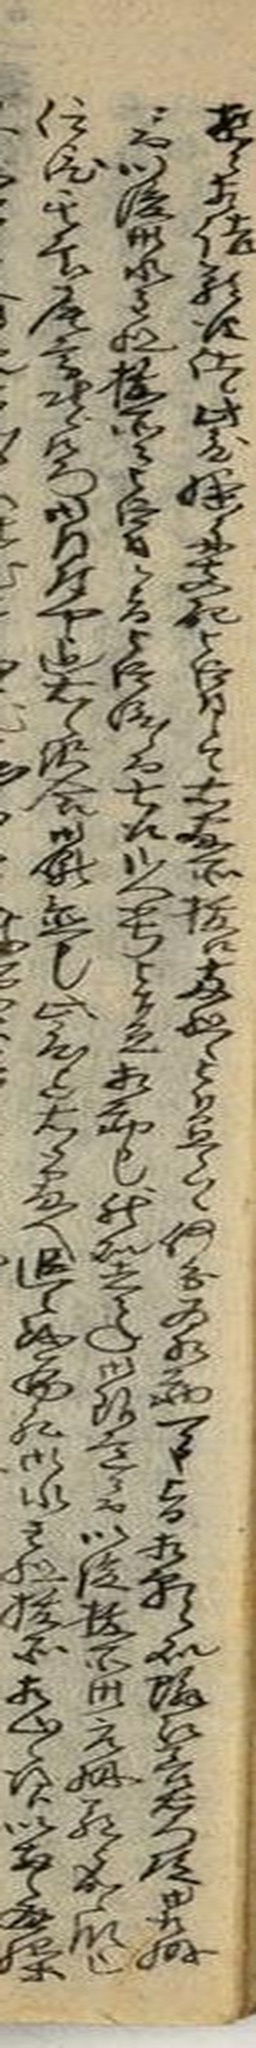仰渡其節尾高次郎左衛門御目付中迄右之訳合御噺置申候此度迄右御番人追々致病死御水主組援所相止候得は以前之通繰
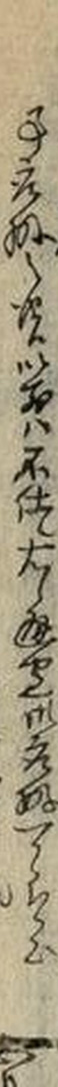事取扱之儀は以前は不仕候右之通宜御取扱可被下候以上
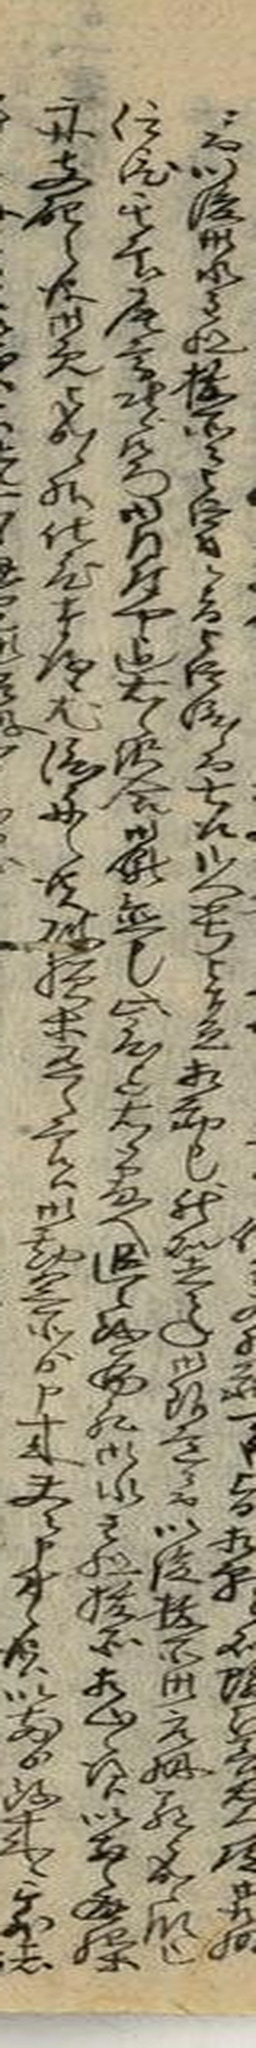舟支配之儀御免被成候様仕度奉存候尤渡舟之儀は破損等有之節は御勘定所ゟ申来夫々申付候儀は以前ゟ致来候其外諸
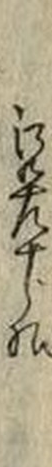江口左十郎様
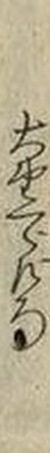大野一郎左衛門
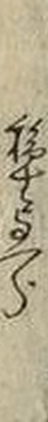五月稲生与一郎
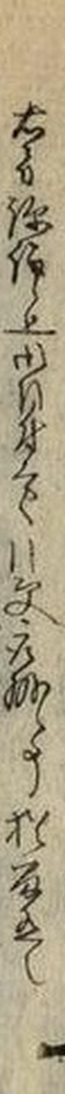右に付評儀之上御目付方へ引受取扱候事猶留有之
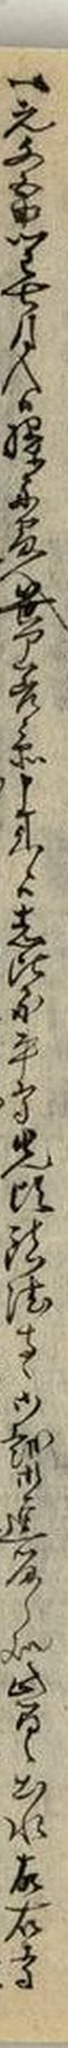一元文五申閏七月八日繰舟番人笹部善兵衛申来候は志比永平寺先頃鎮徳寺へ御越御逗留之処此間之出水故右寺
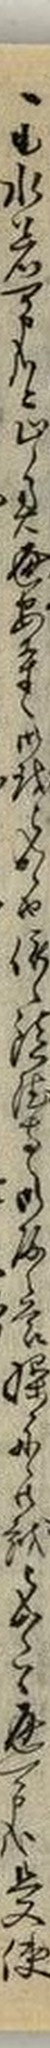へも水着可申哉と山ノ奥通安寺へ御越被成候由依之鎮徳寺へ御帰之節繰舟へ御越被成候はゝ通可申哉且又使
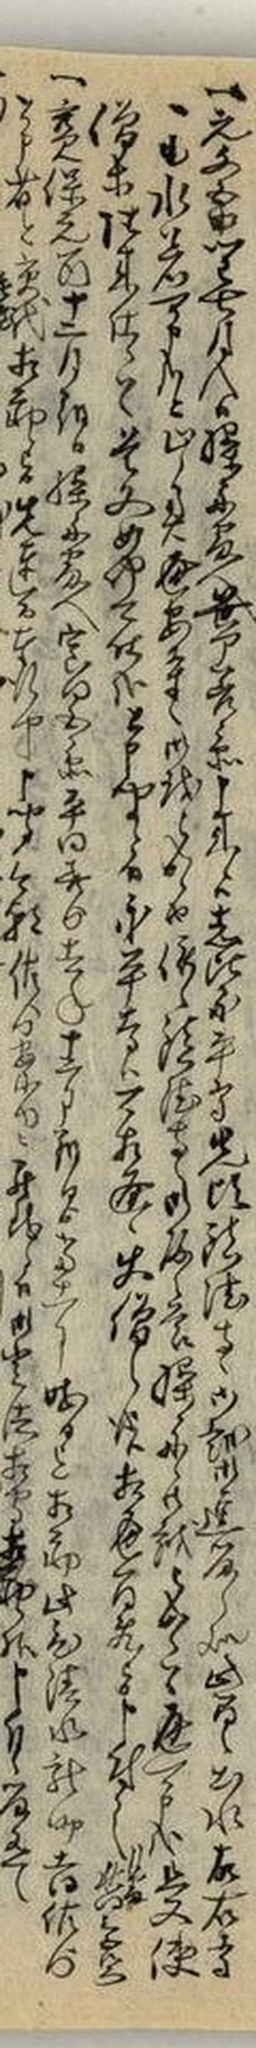僧等往来仕候はゝ是又如何可仕哉と申聞候に付永平寺は可相通候使僧之儀は相通間敷旨申付之月番秋田三五左衛門
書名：御城下諸事之部
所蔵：福井県文書館 Fukui Prefectural Archives
